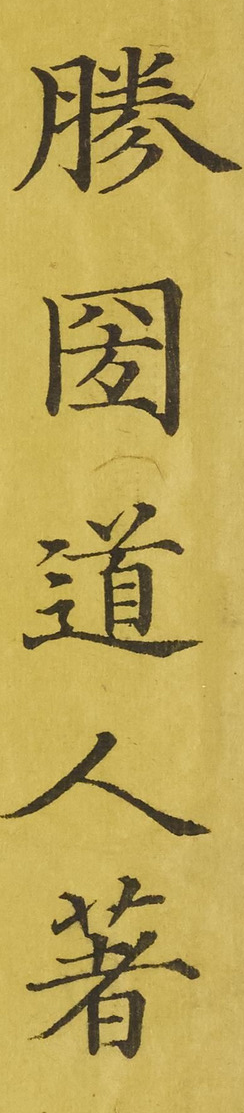勝圀道人著
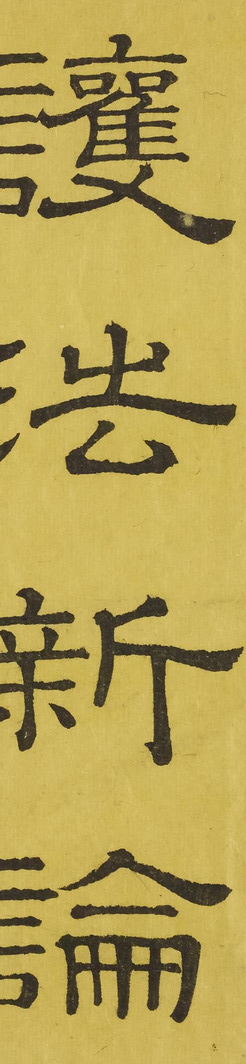護法新論
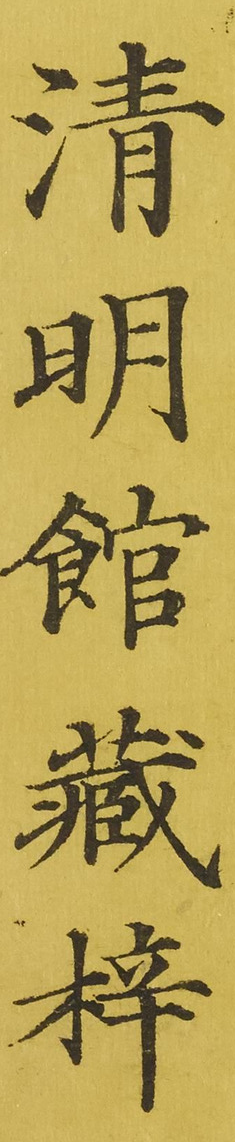清明館藏梓
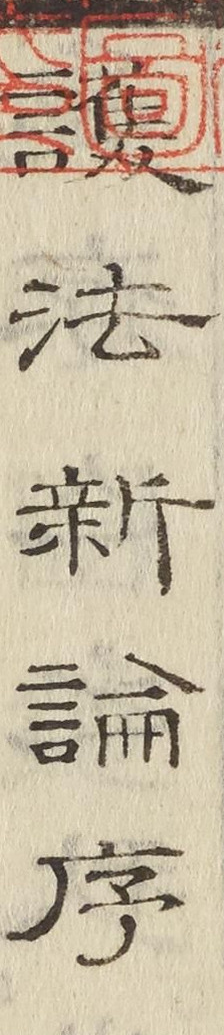護法新論序
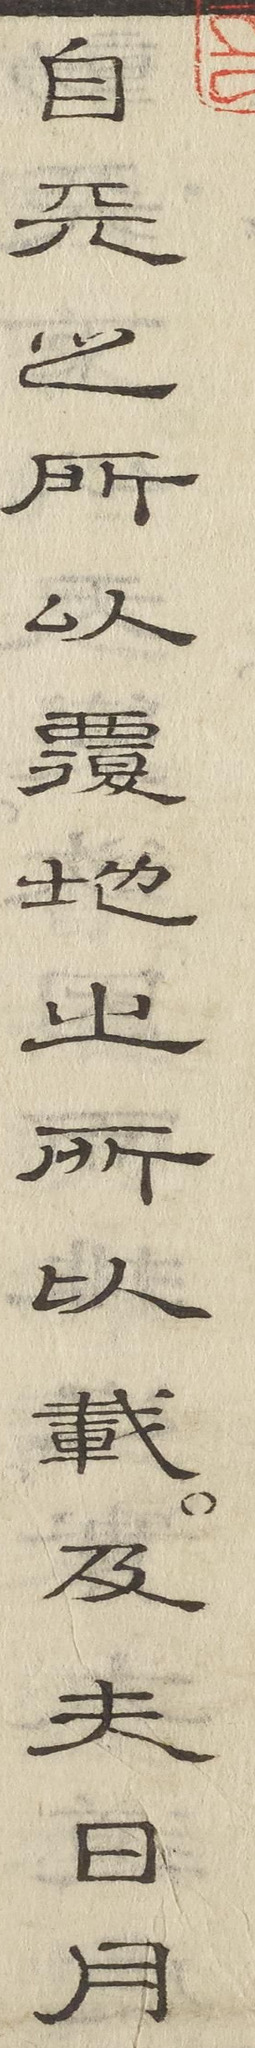自天之所以覆地之所以載。及夫日月
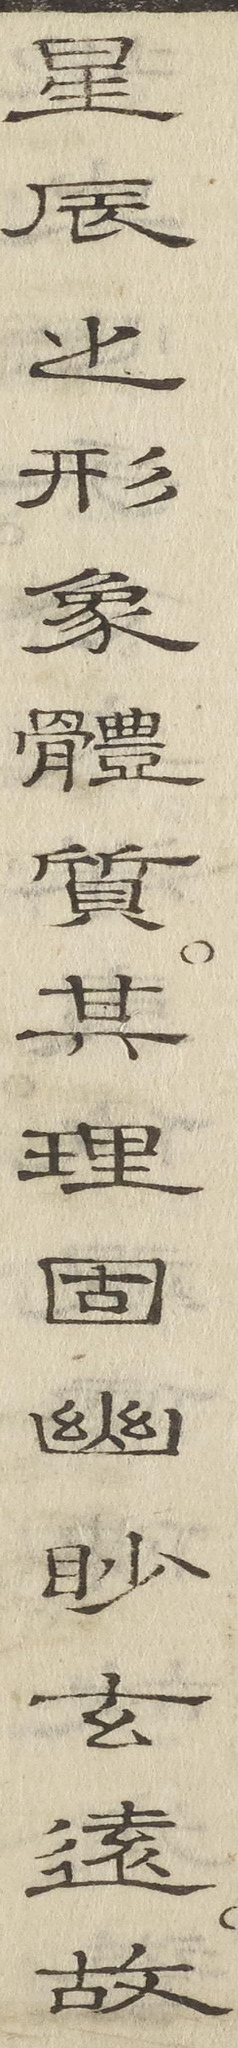星辰之形象體質。其理固幽妙玄遠。故
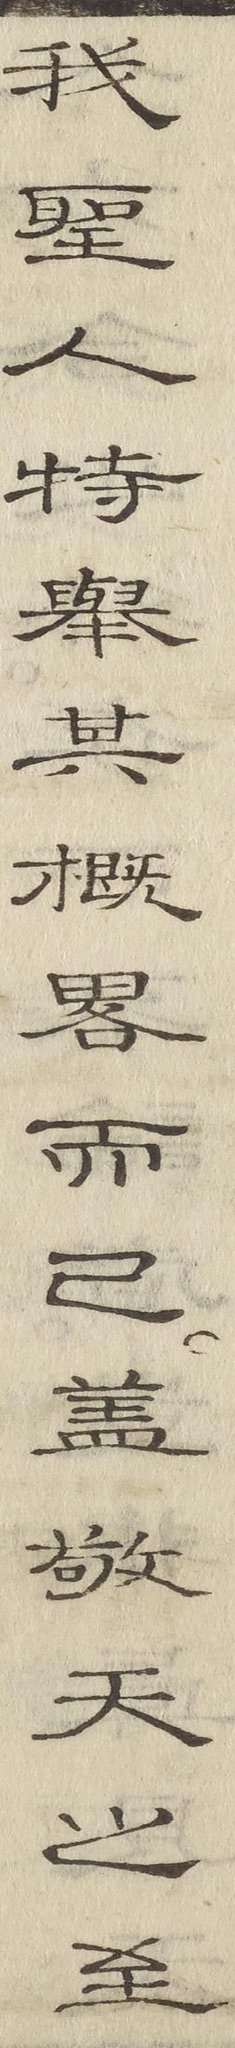我聖人特舉其概畧而已。蓋敬天之至
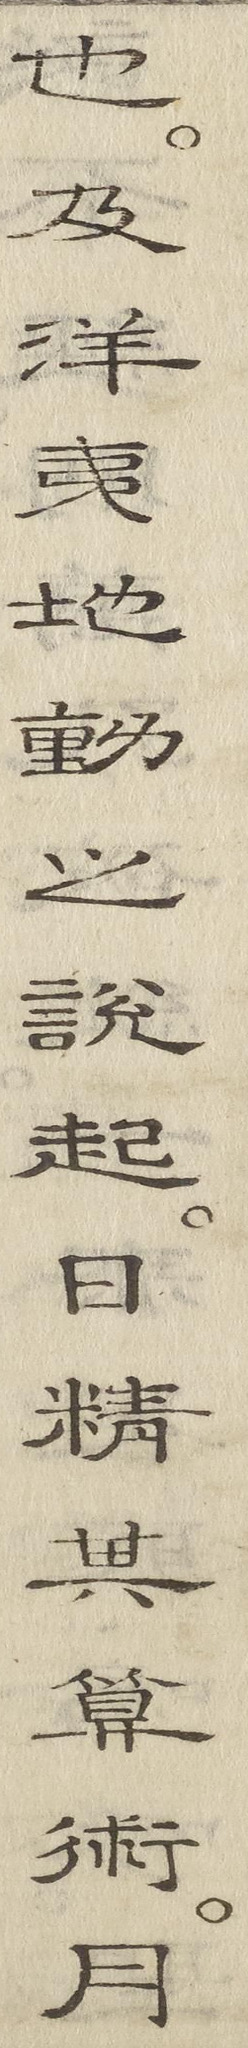也。及洋夷地動之説起。日精其算術。月
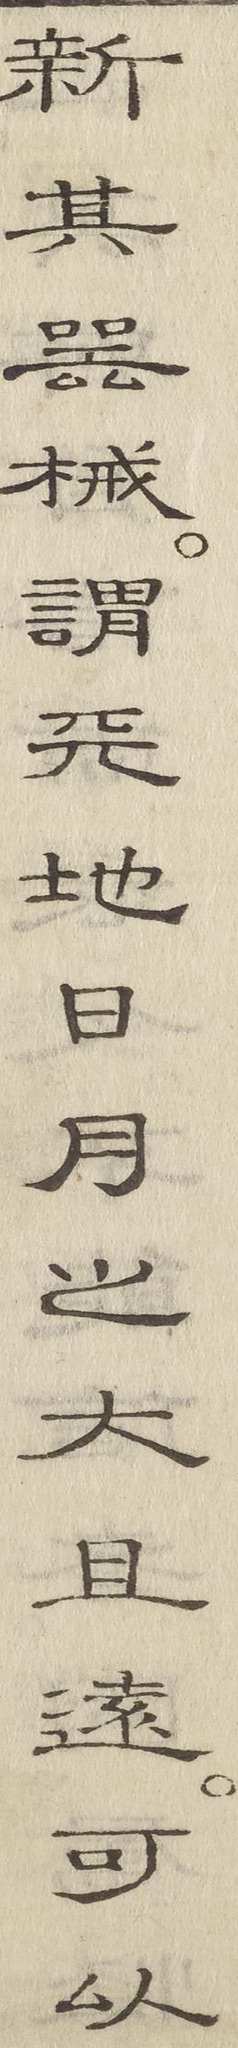新其器械。謂天地日月之大且遠。可以
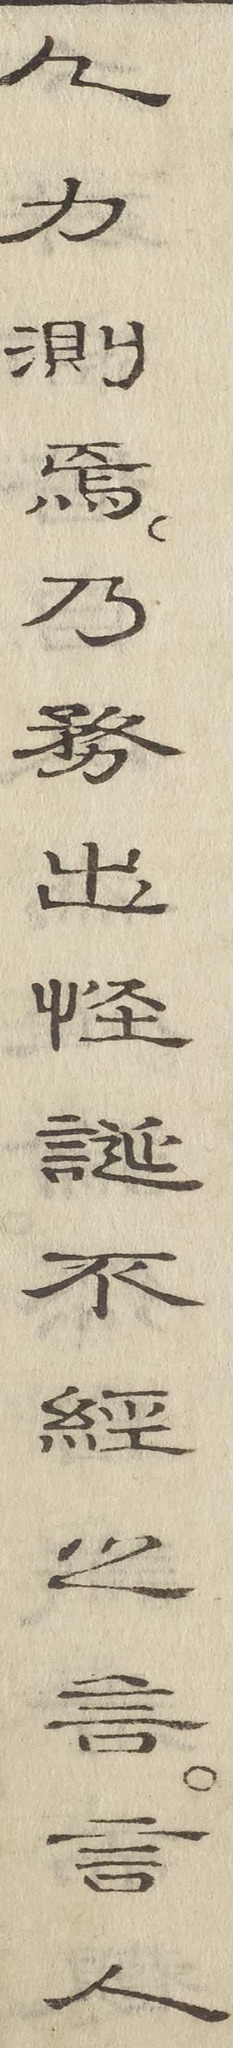人力測焉。及務出軽誕不經之言。言人

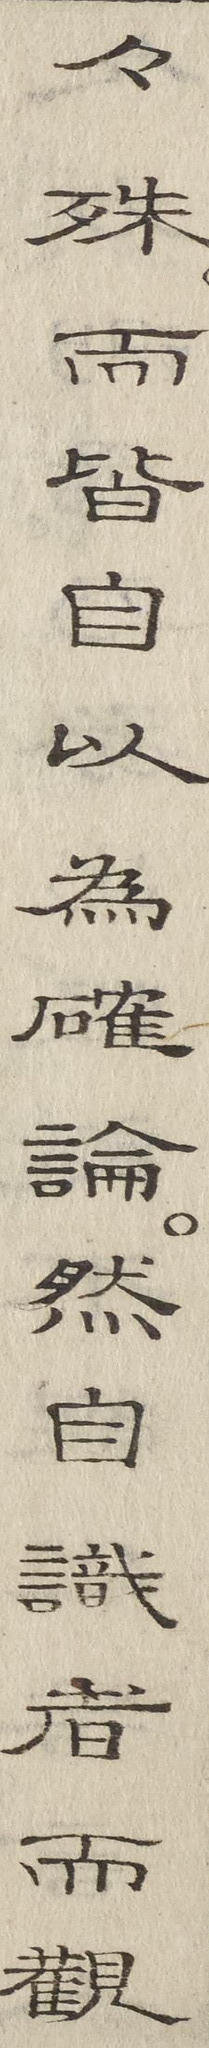々殊。而皆自以為確論。然自識者而観
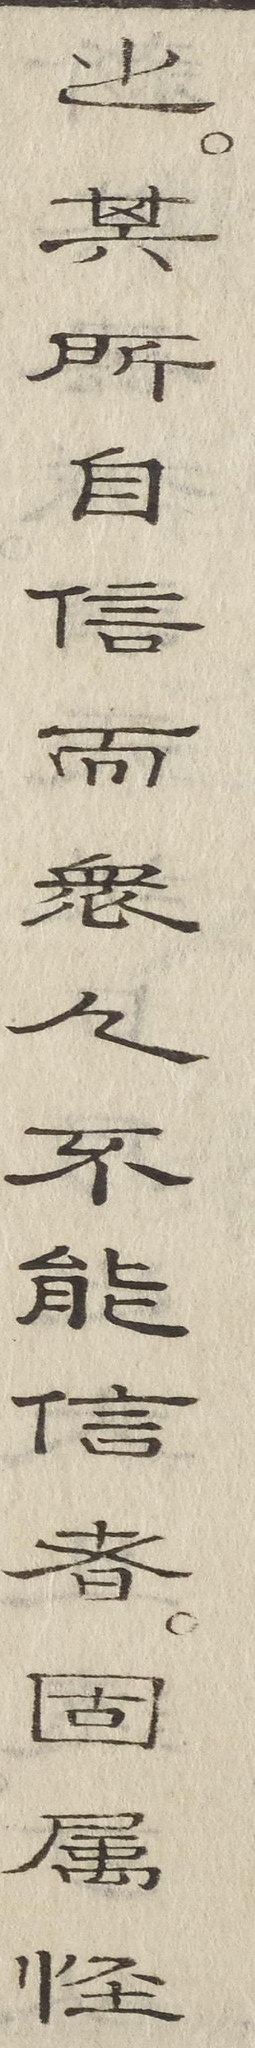之。其所自信而衆人不能信者。固属怪
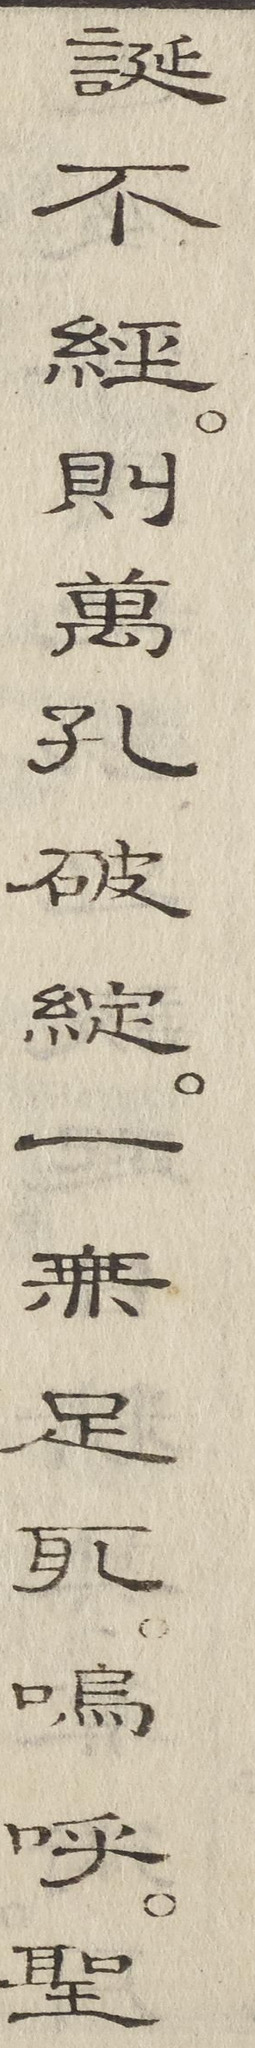誕不経。則萬孔破綻。一無足死。嗚呼。聖
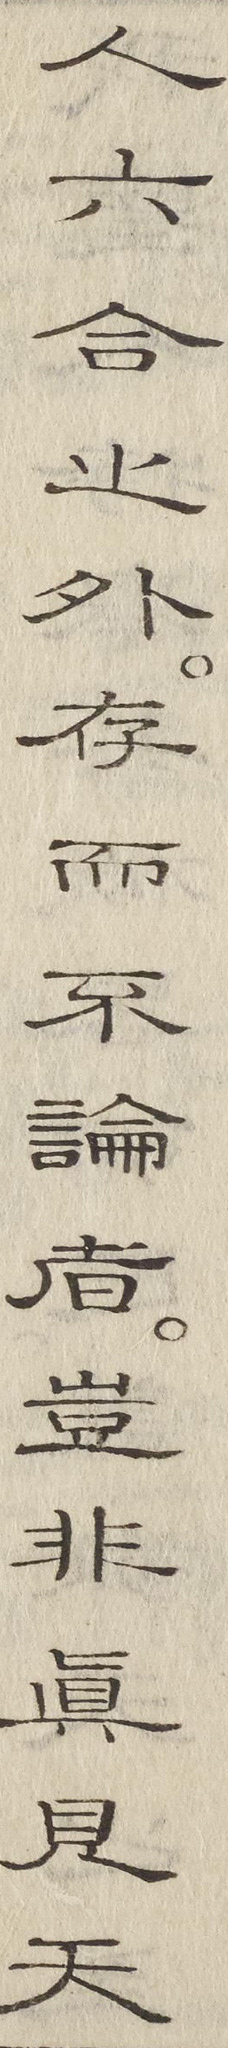人六合之外。存而不論者。豈非真見天
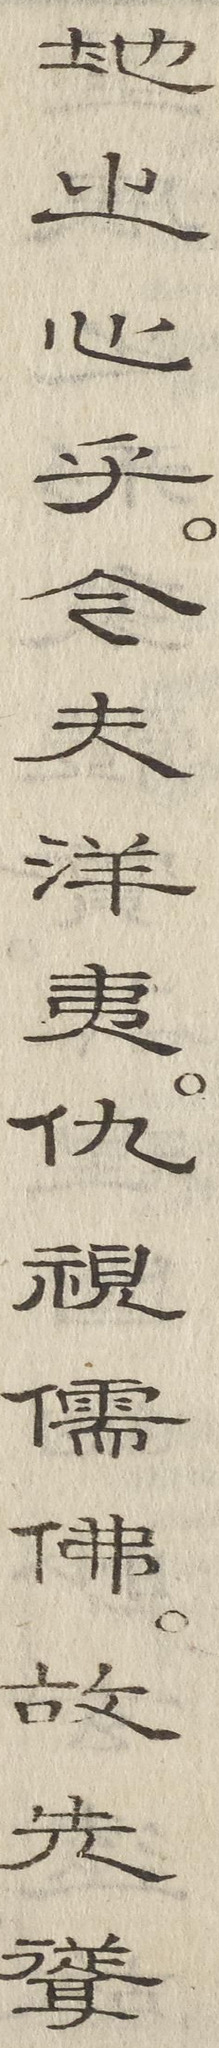地之心乎。今夫洋夷。仇視儒仏。故先聳
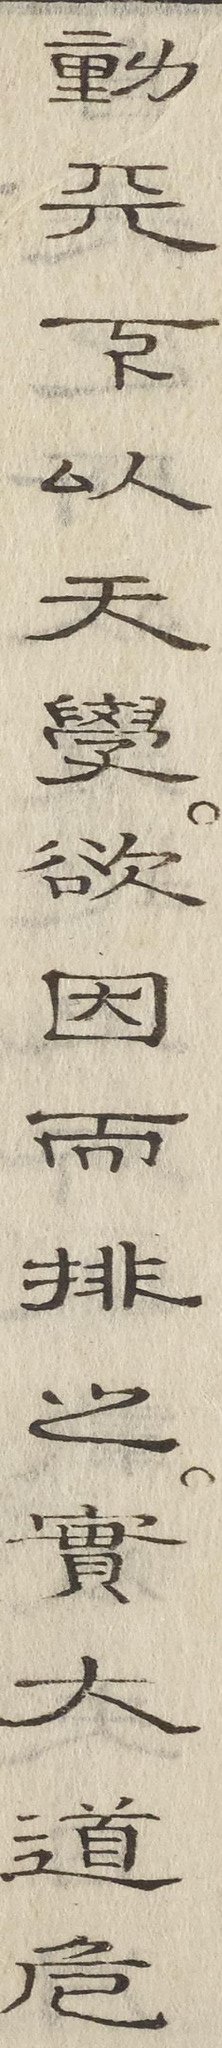動天下以天学。欲因而排之。実大道危
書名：護法新論　上
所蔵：東京大学地震研究所図書室 Earthquake Research Institute Library, The University of Tokyo, JAPAN
